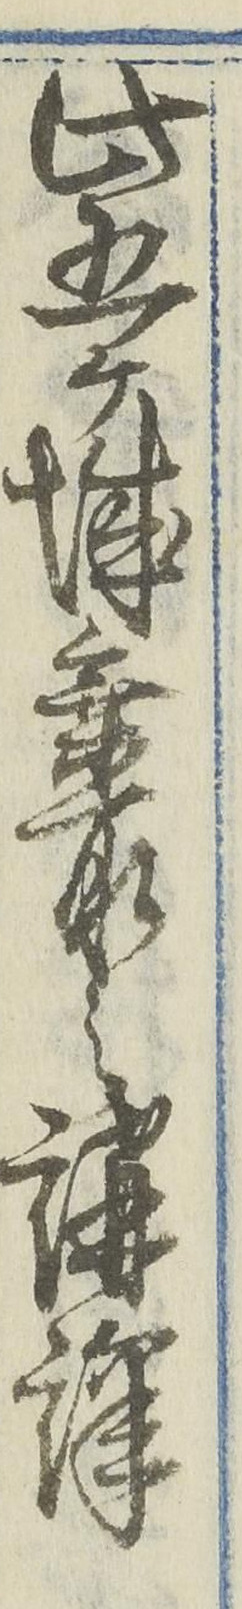此五ケ城乗取之講訳

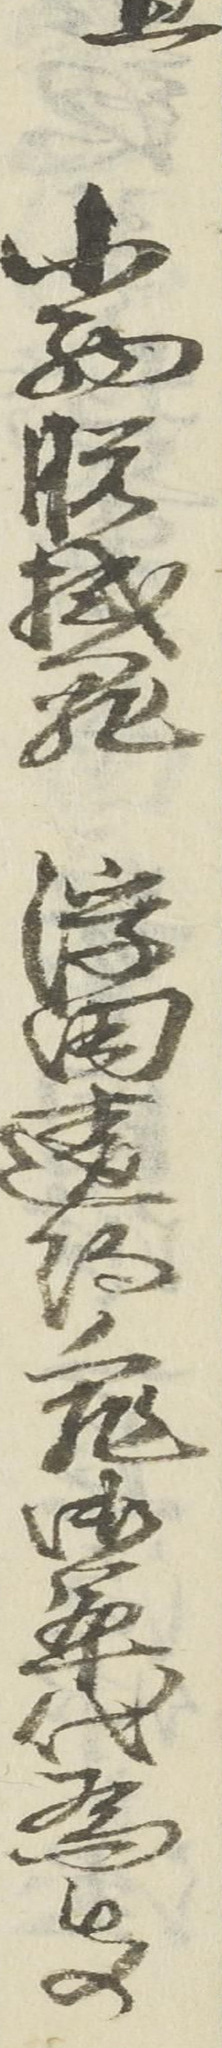且小西脱掛罪浮田違約ノ罪御軍代為もの
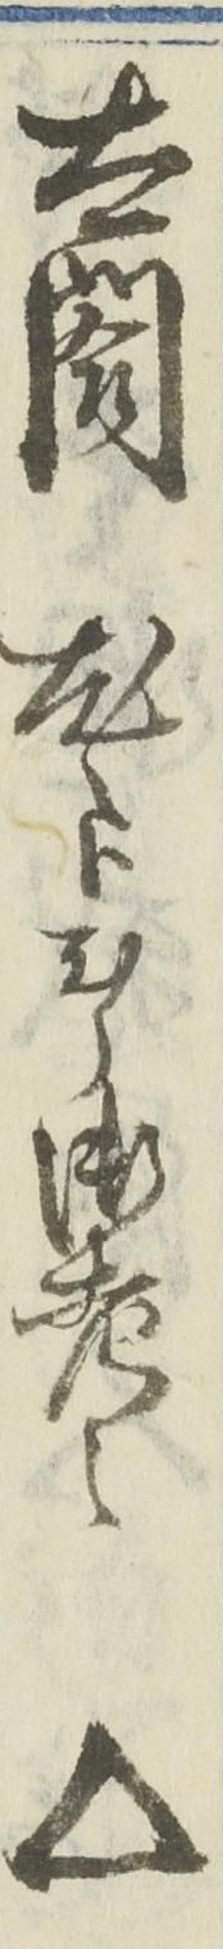太閤尤二ト云ウ御考之△
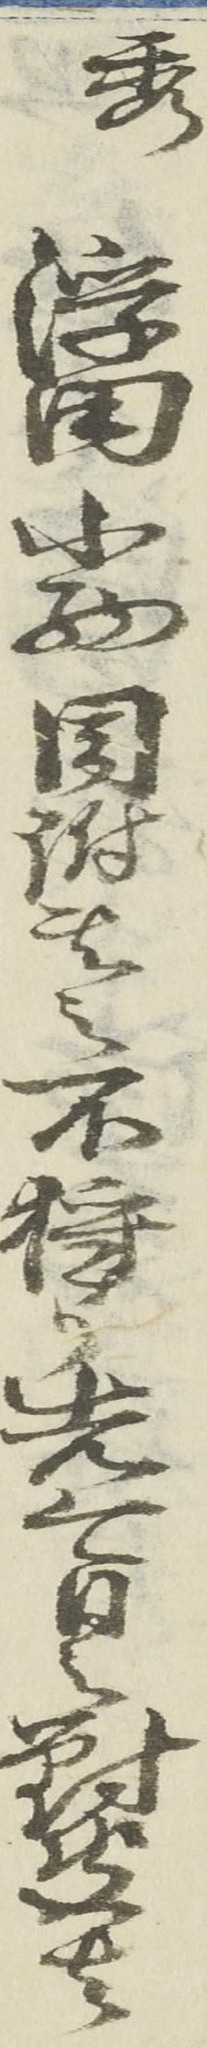秀浮田小西目附共之不埒ナり先今日之対決は
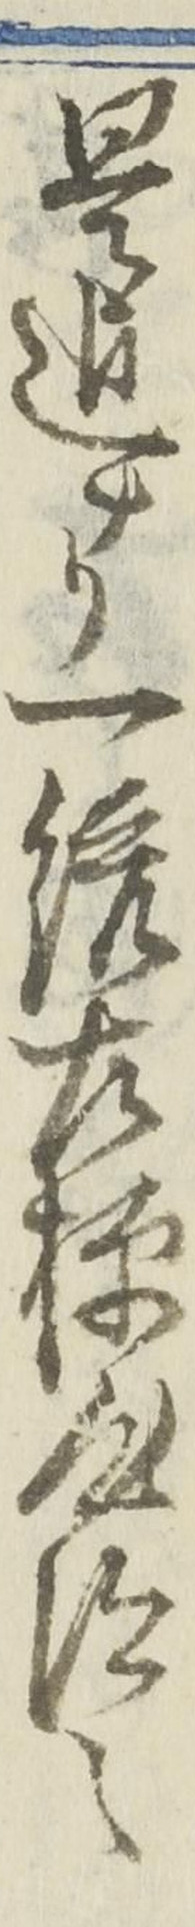是迄ナリ一統左様心得之
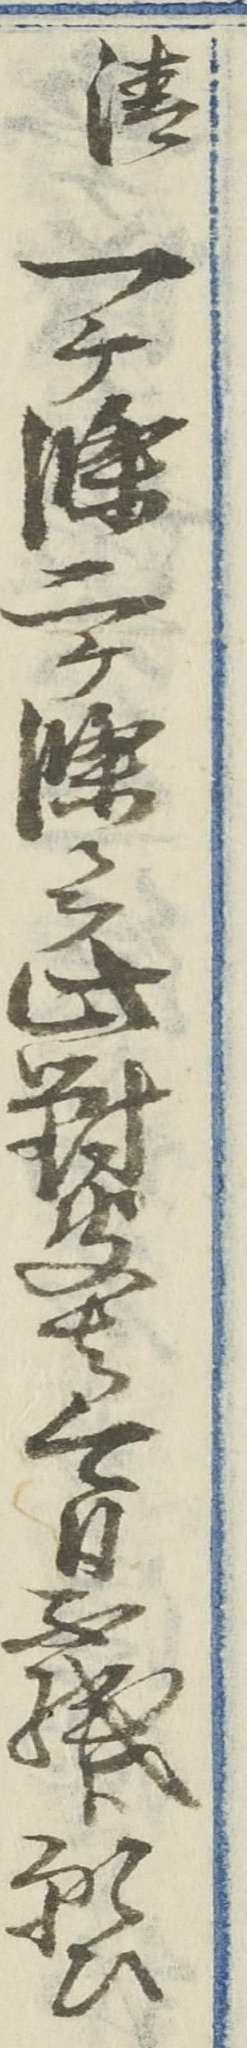清一ヶ條二ケ條二テ此対決は今日不残ト願ひ
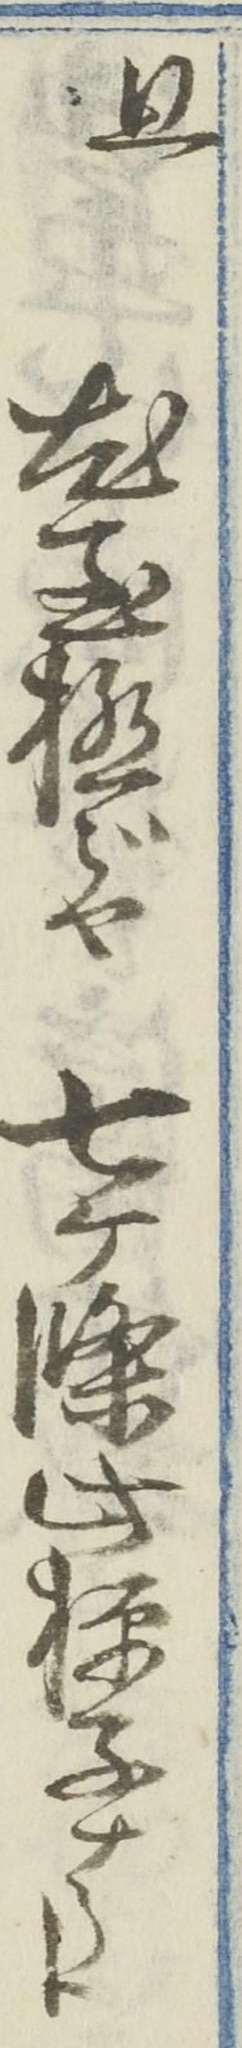且尤至極じヤ七ヶ條此様子ナリト
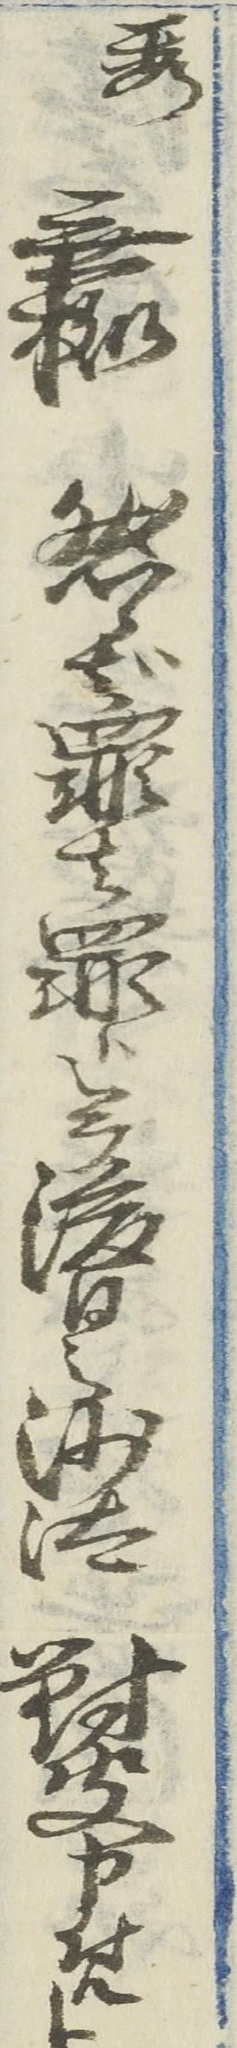秀無拠然らば罪は罪トしテ後日之沙汰対決申付ㇽト
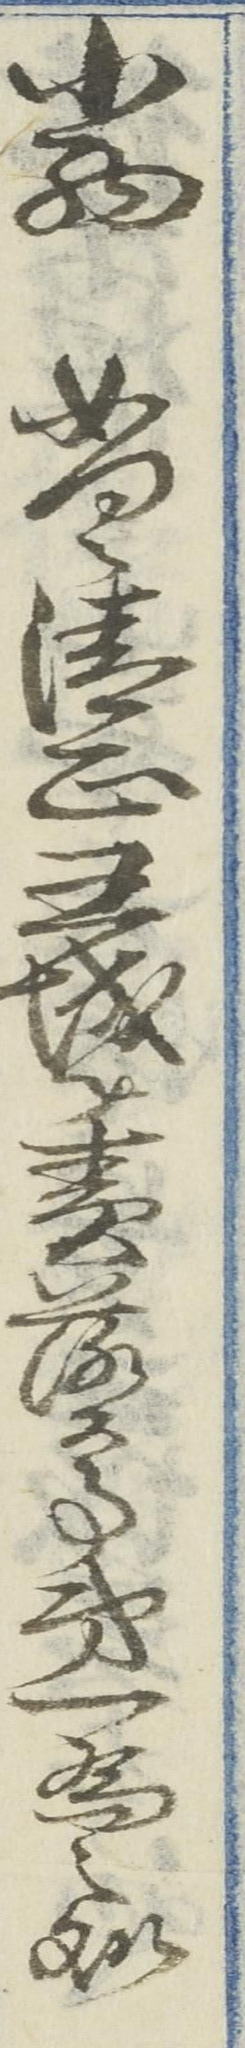小西如何二清正王城ヲ責落ㇲ事第一為之処
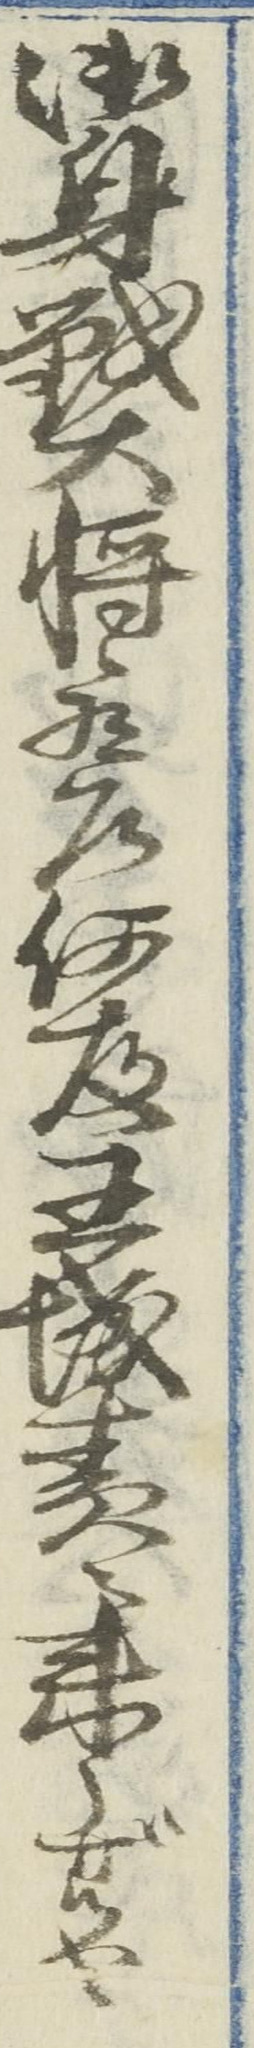御身戦大将二有乍何故王城責二来らザㇽヤ
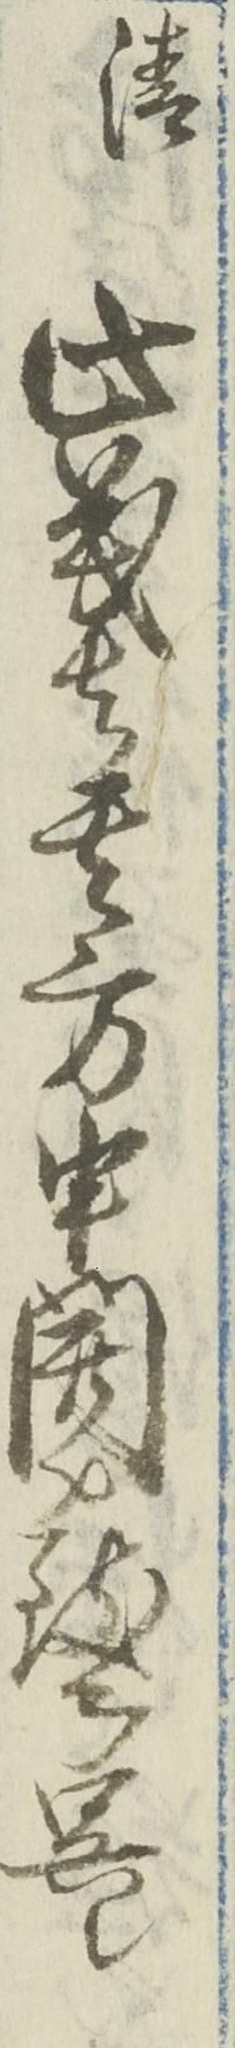清此義は其方申開ヲ致テ呉レ
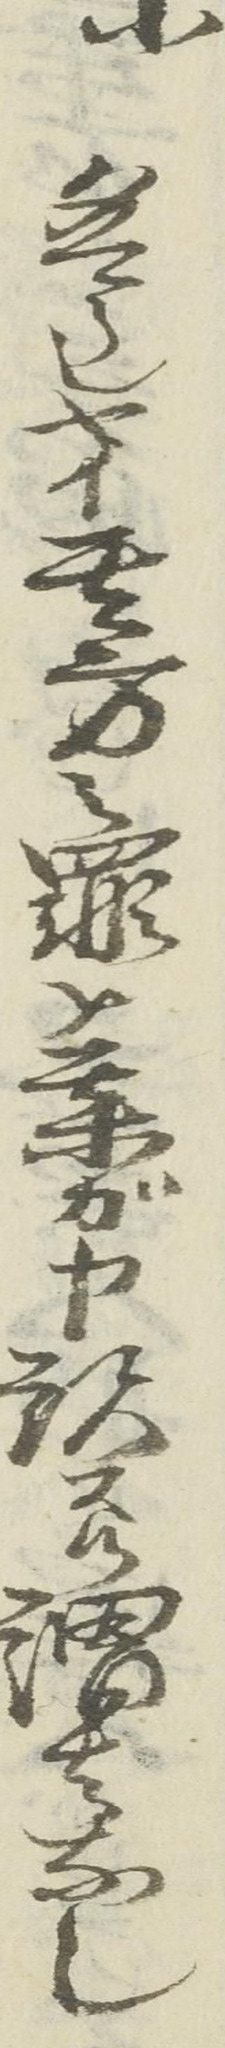小タマらしヤイ其方之罪ヲ某ガ申訳スル謂はなし
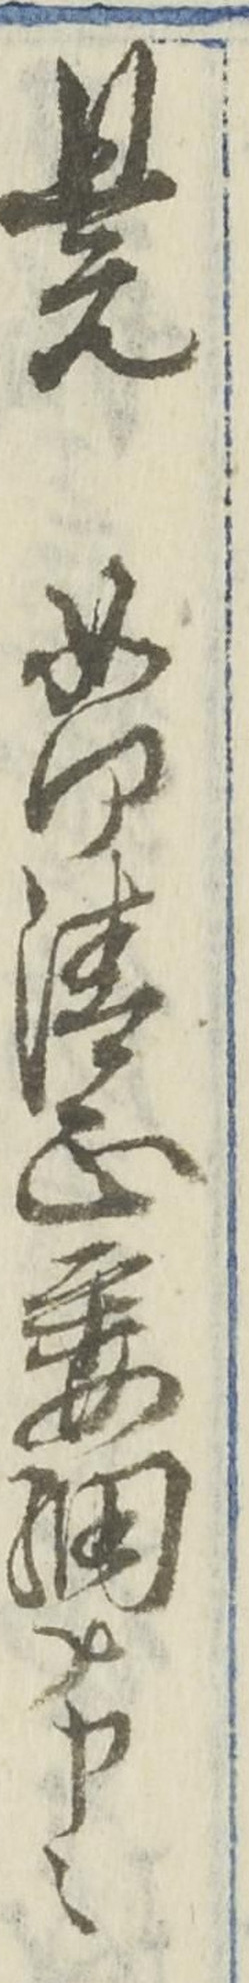且元如何清正委細ヲ申之
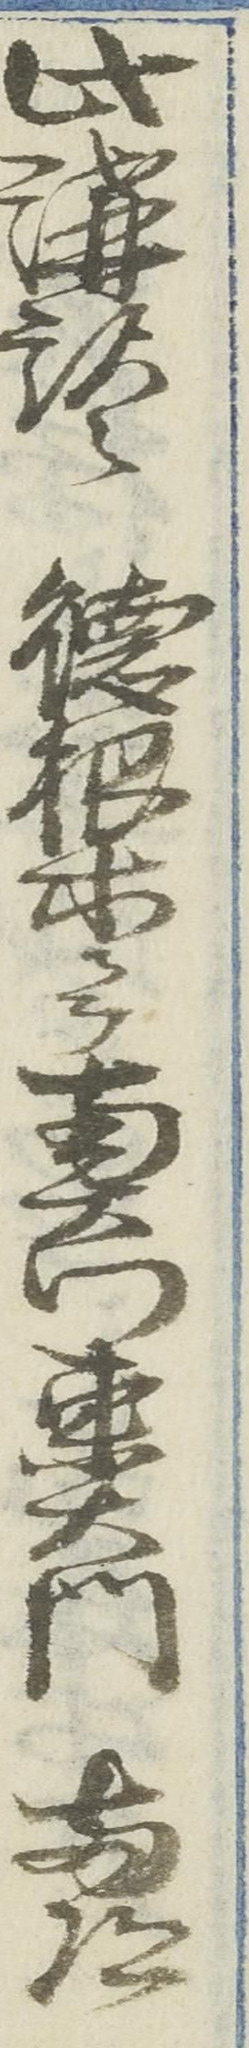此講釈之徳根木ニテ南大門東大門両道
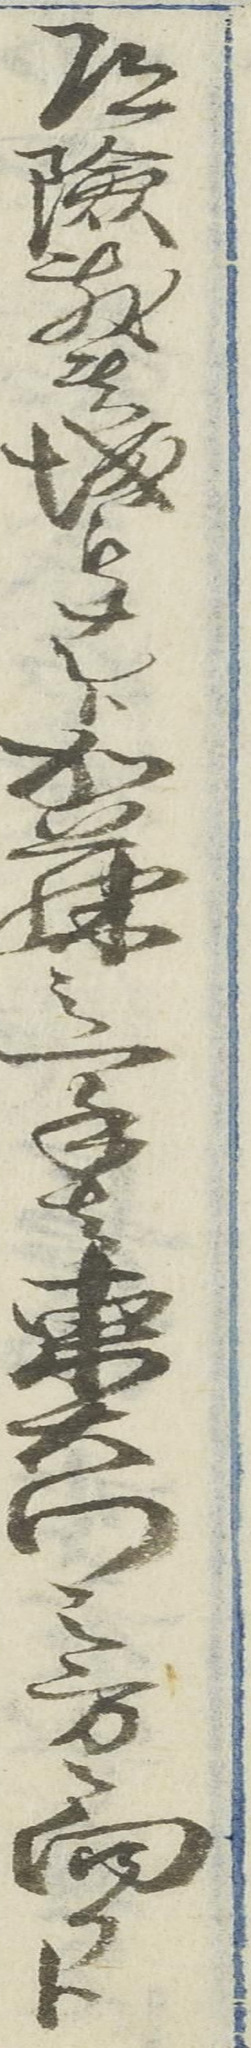道険敷共城もナレト加藤之一手は東大門之方二向ウト
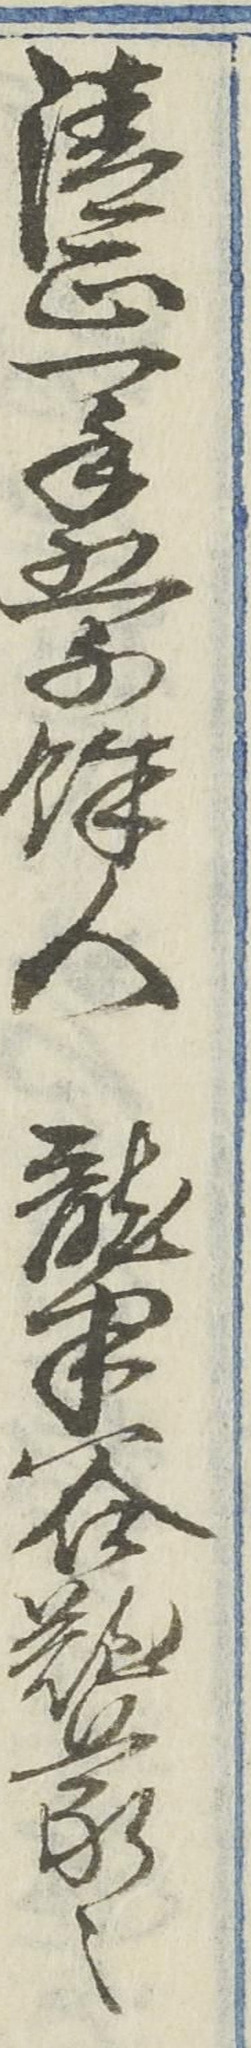清正一手五千餘人龍半谷難義
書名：伏水大地震
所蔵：東京大学地震研究所図書室 Earthquake Research Institute Library, The University of Tokyo, JAPAN
